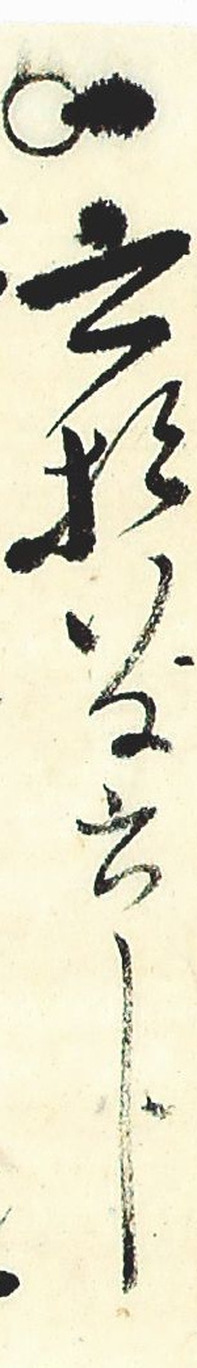一六拾八匁六分
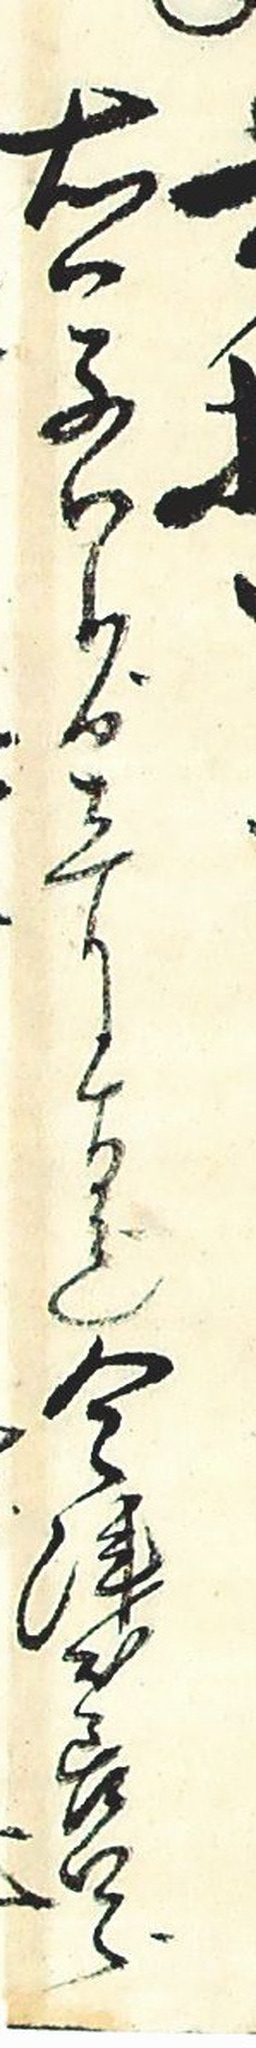右は子八月ゟ十二月十日迄今津屋善四郎
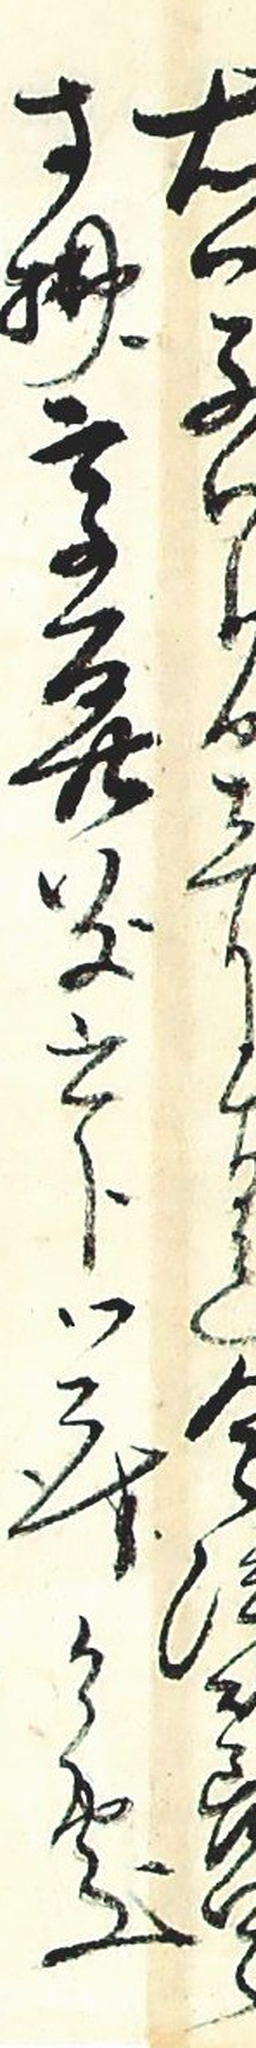寸払高百廿八匁六分御座候処
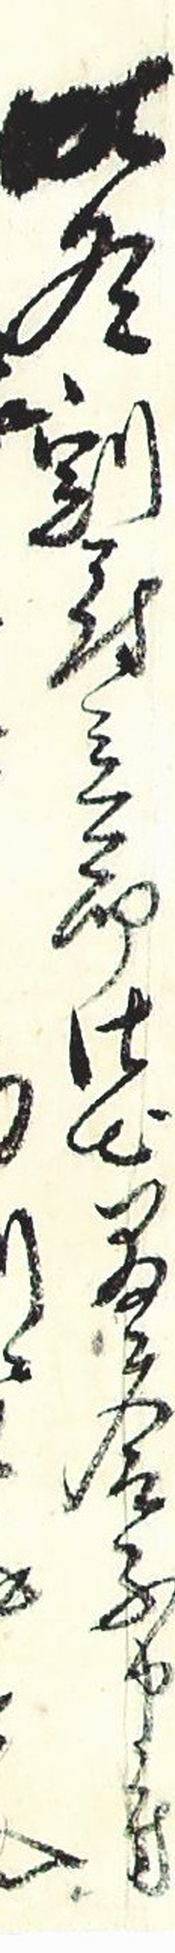昨冬割苻之節仕出間に合不申に付
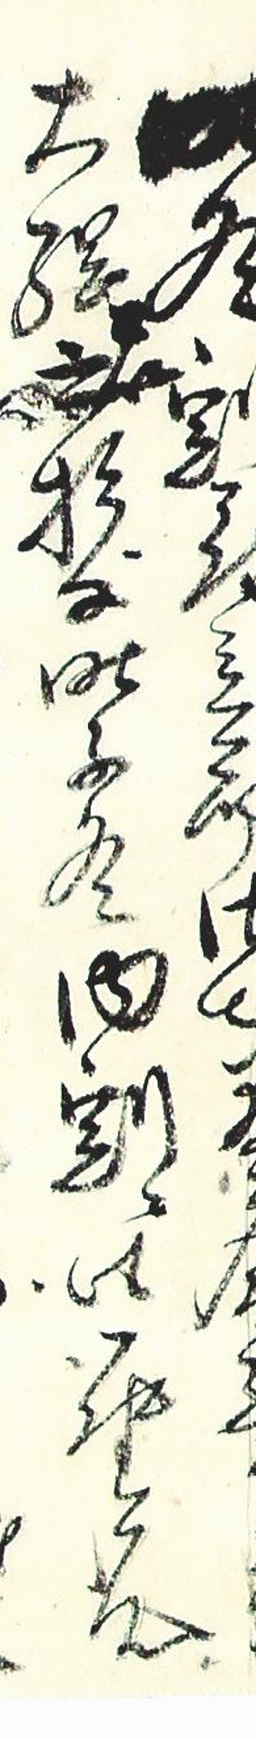大綱六拾匁昨子冬内割に仕御座候所
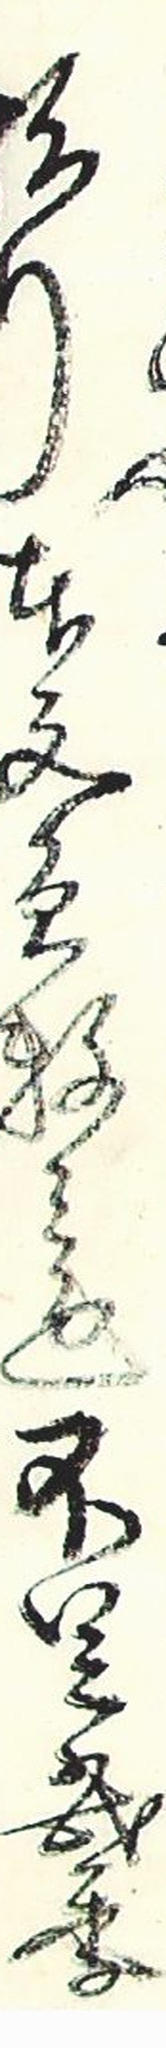指引本文員数之通不足当季

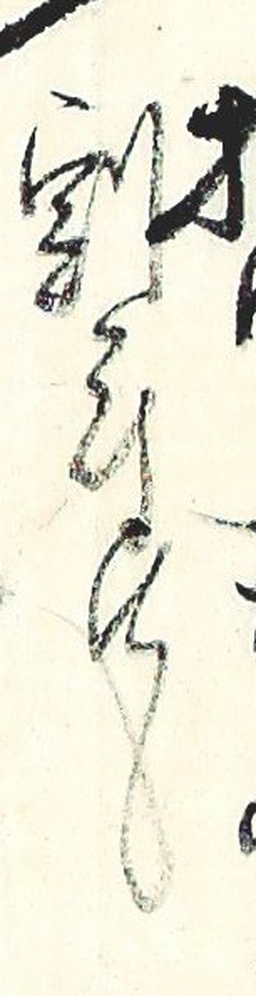割苻仕候
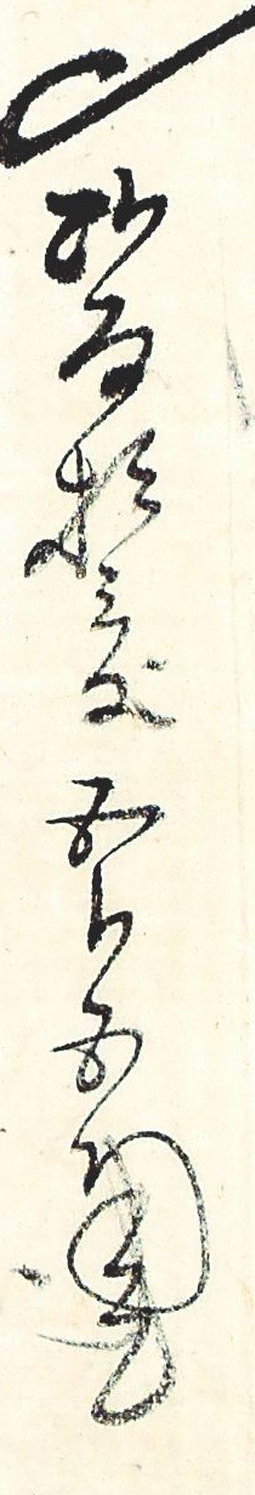〆弐百拾三匁五分五厘也
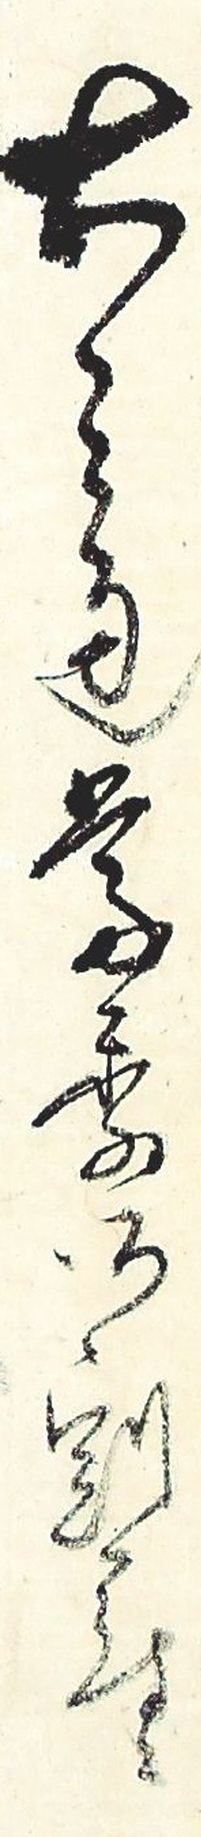右之通当季御割苻に
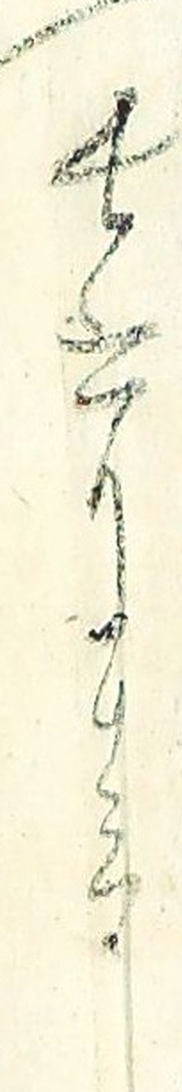丑六月十三日
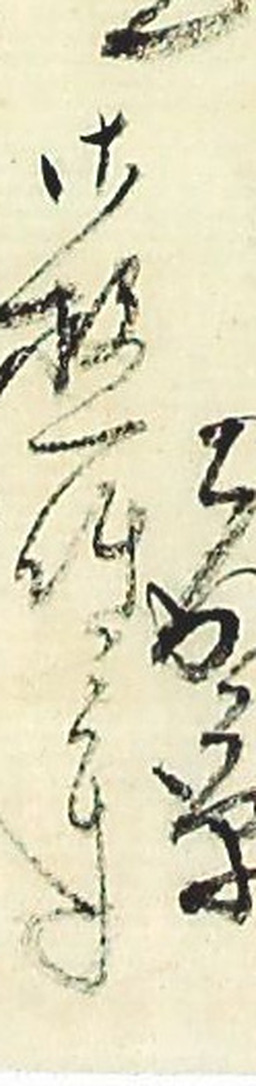御救一件に付
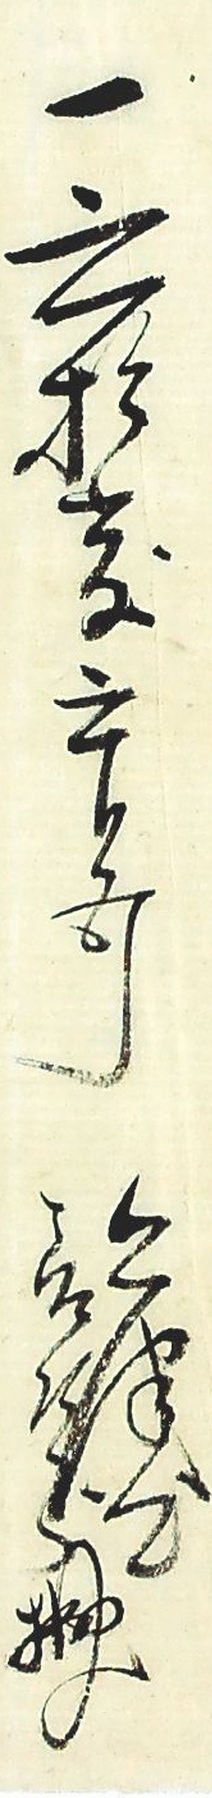一六拾六匁五厘今津屋
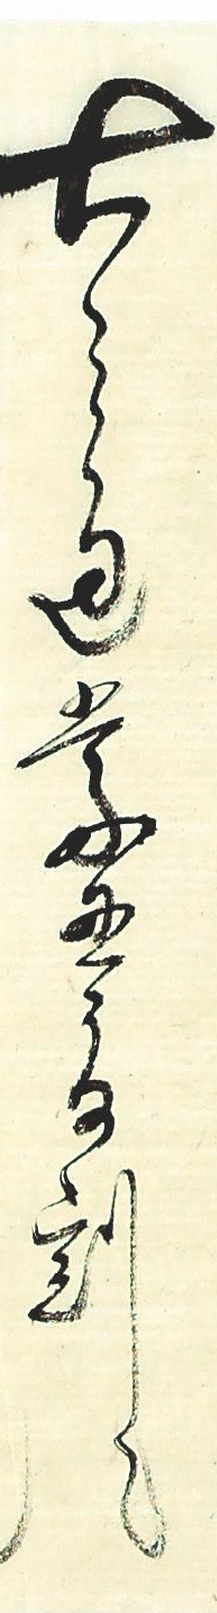右之通当丑夏割に
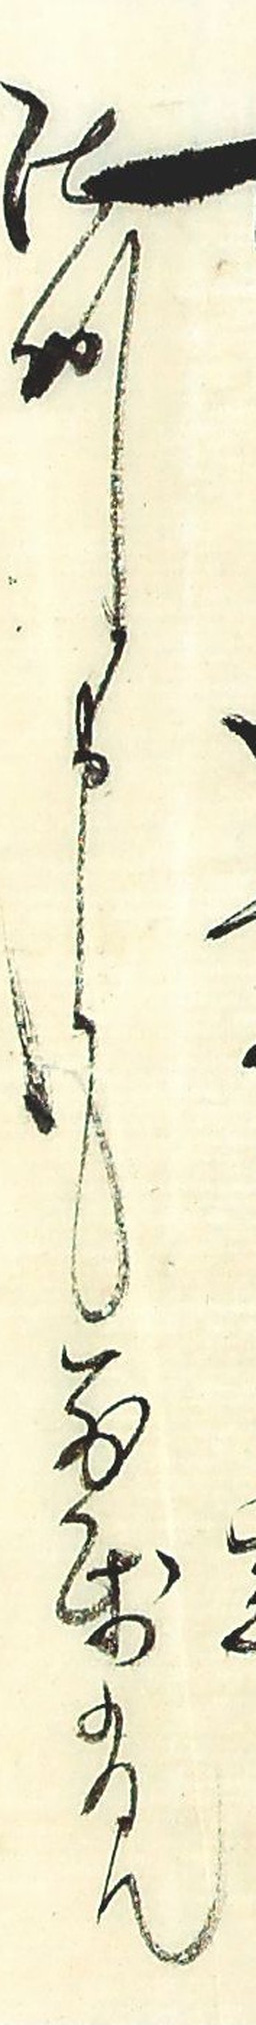仕出し申候以上別紙有る
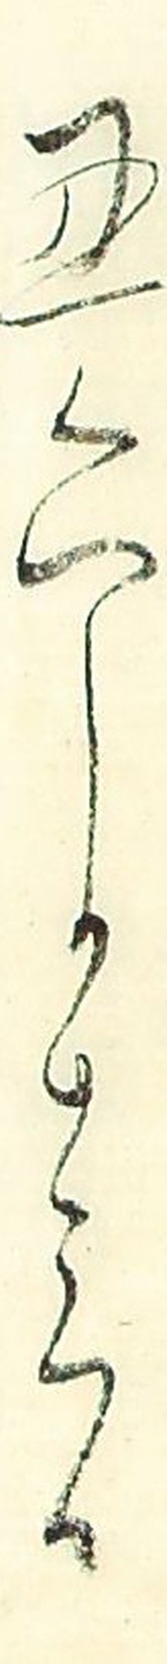丑六月十三日
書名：名東郡中諸割賦元帳
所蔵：鳴門教育大学 Naruto University of Education
